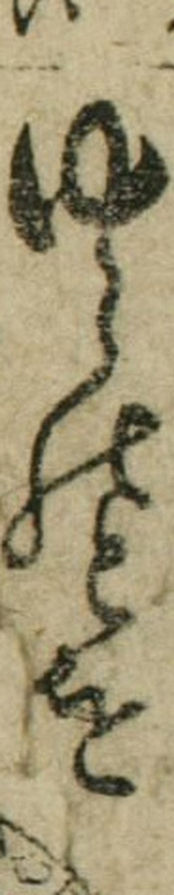ゆらのとを
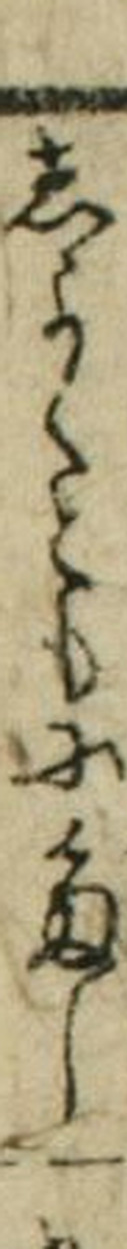しよくともに多し
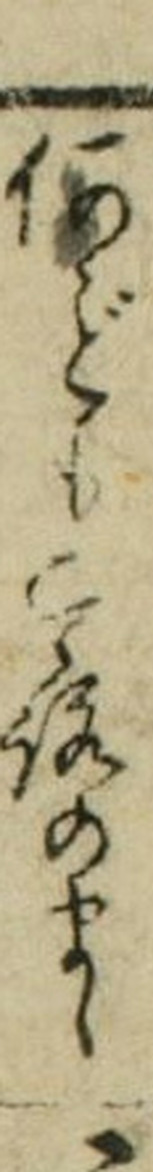何ごともこゝろのまゝ
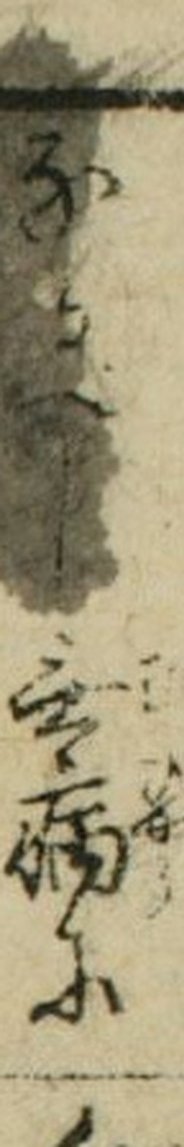なるべし無病に
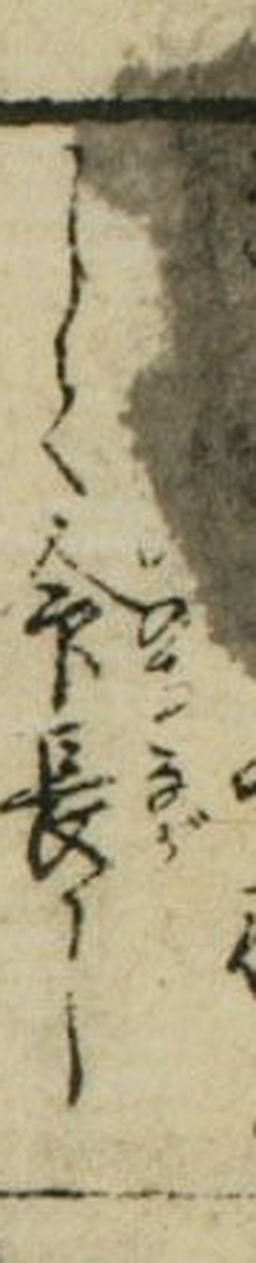して命長し
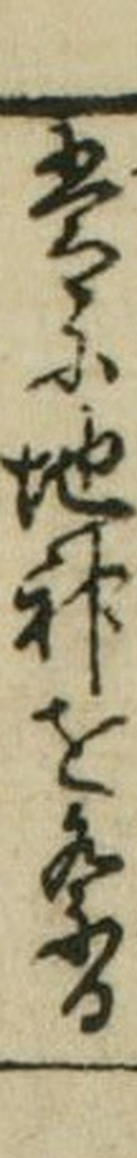常に地神を祭る
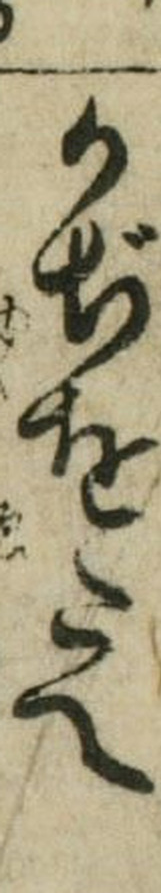かぢをたえ
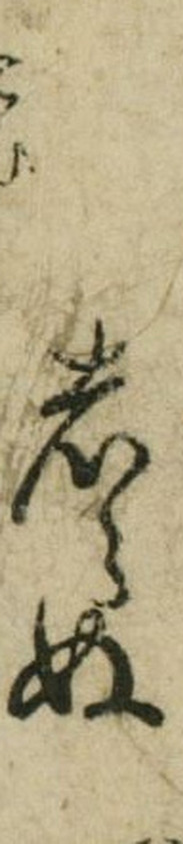しらぬ
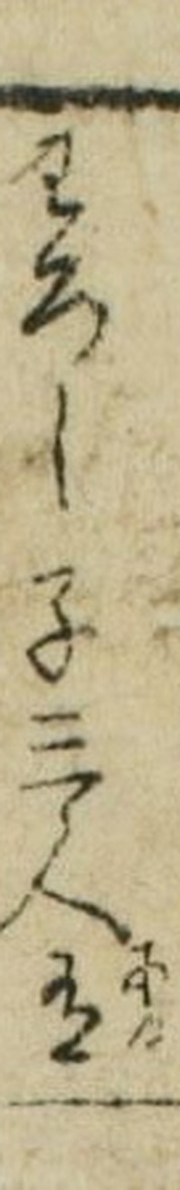わろし子三人有
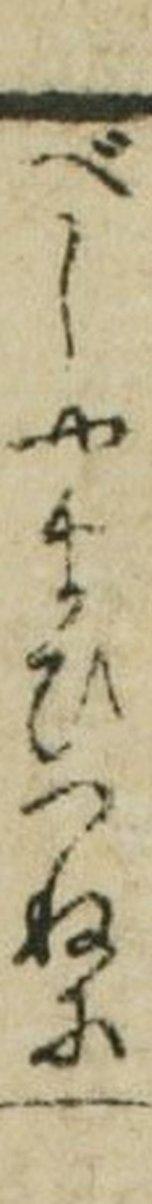べしやまひつねに
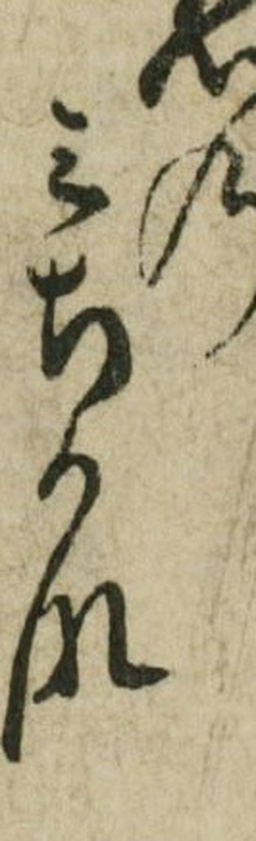みちかな
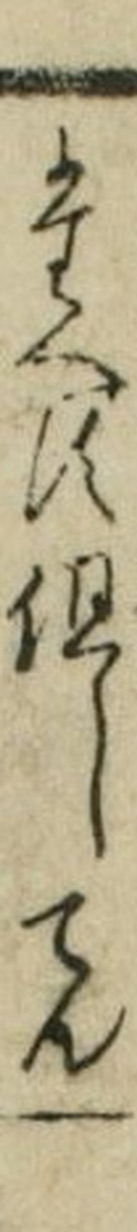たへす但してん
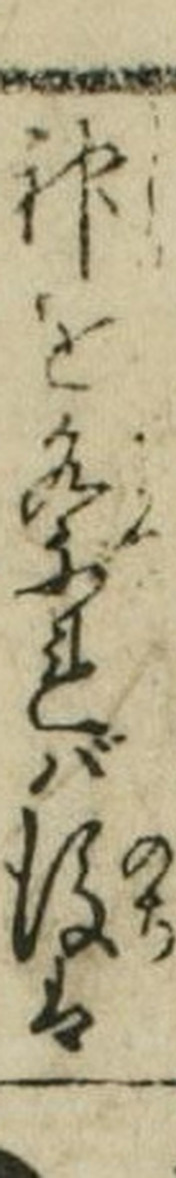神を祭れば後は
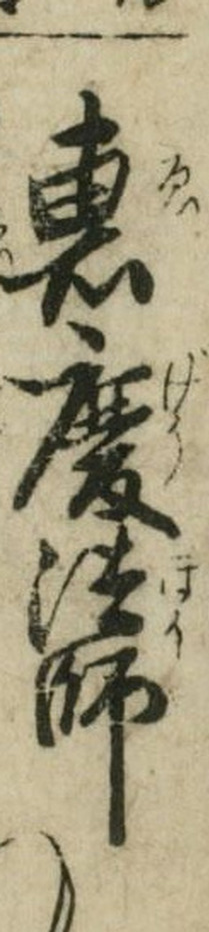恵慶法師
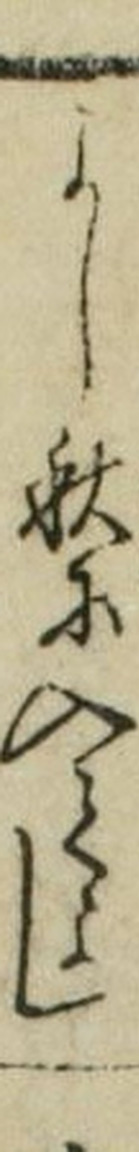よし秋に入てよし
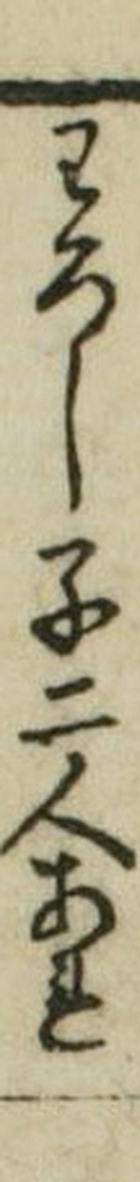わろし子二人あれ
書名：百人一首
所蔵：東京学芸大学教育コンテンツアーカイブ
